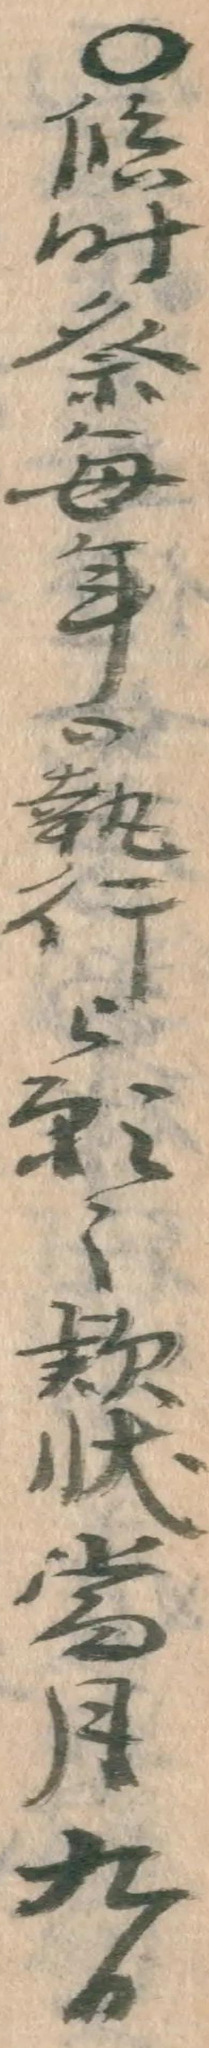○臨時祭毎年御執行被願之歎状、當月九日
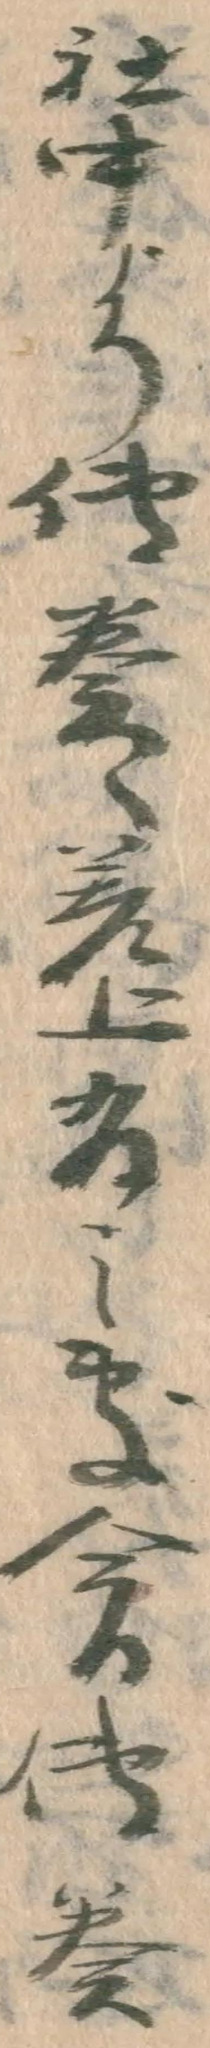社中より傳奏へ差上有之處、今日傳奏
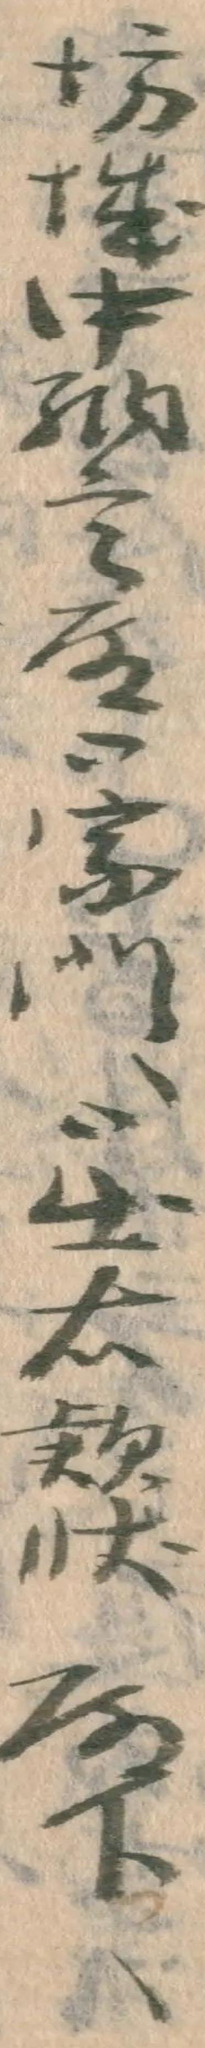坊城中納言殿御家門へ御出、右歎状殿下へ
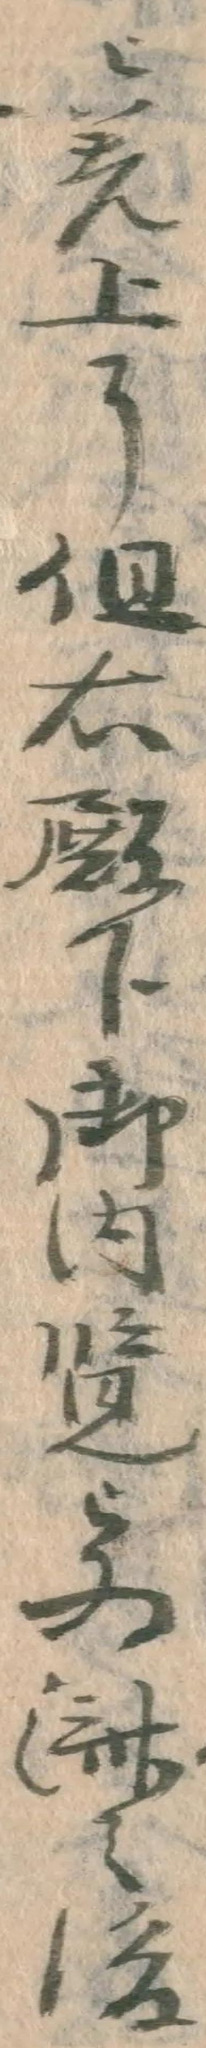被差上了、但右殿下御内覧被為済之後
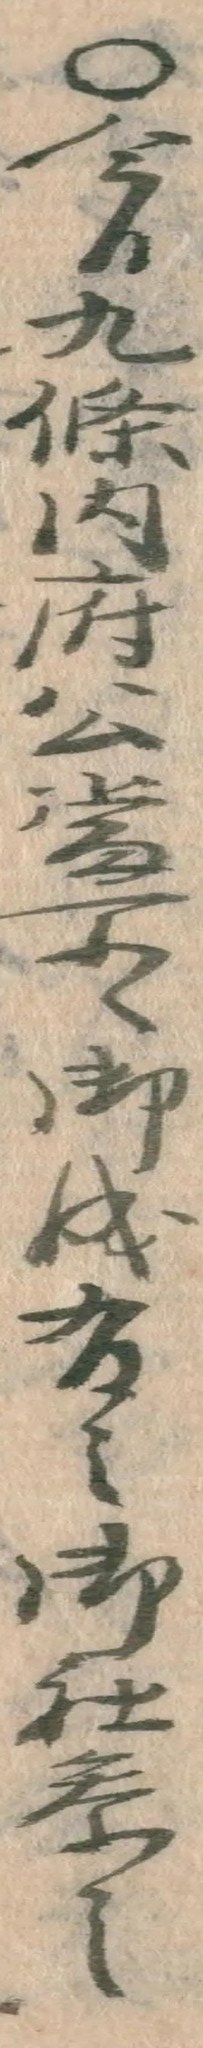○今日九條内府公當所へ御成有之、御社参之
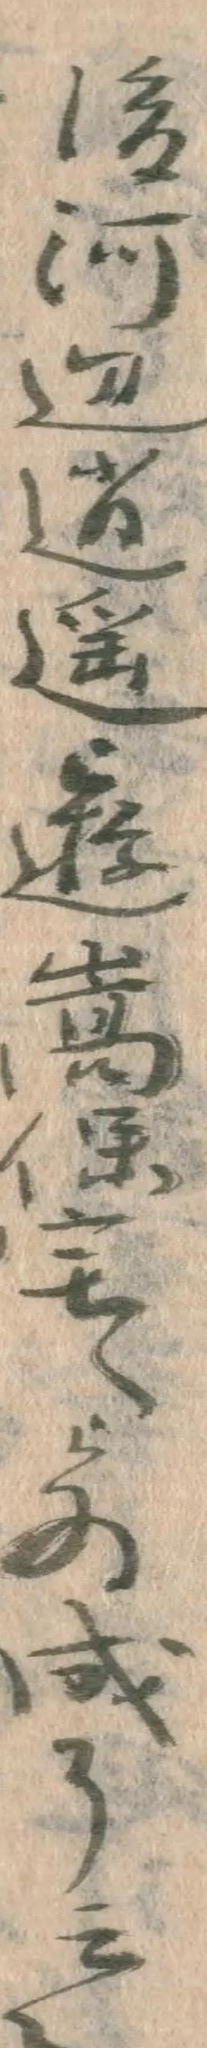後、河辺逍遥被遊、嵩保宅へ被為成了云々、
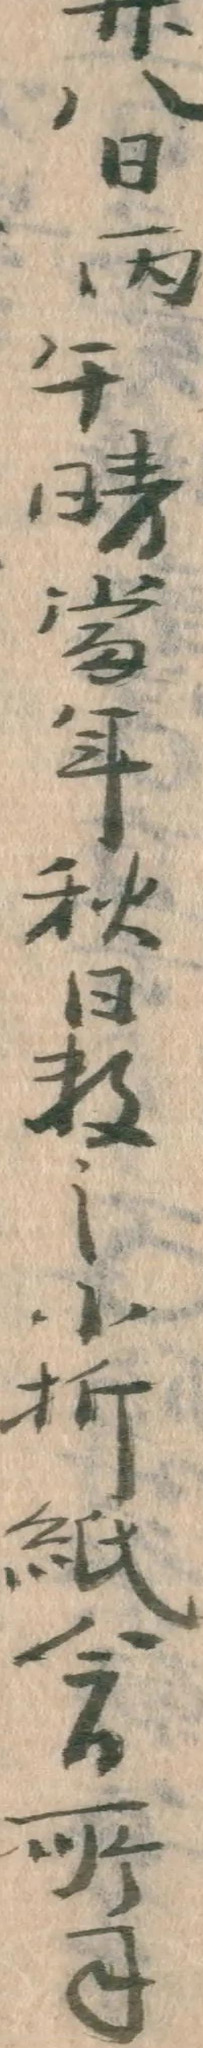廿八日丙午晴當年秋日数之小折紙今日所司
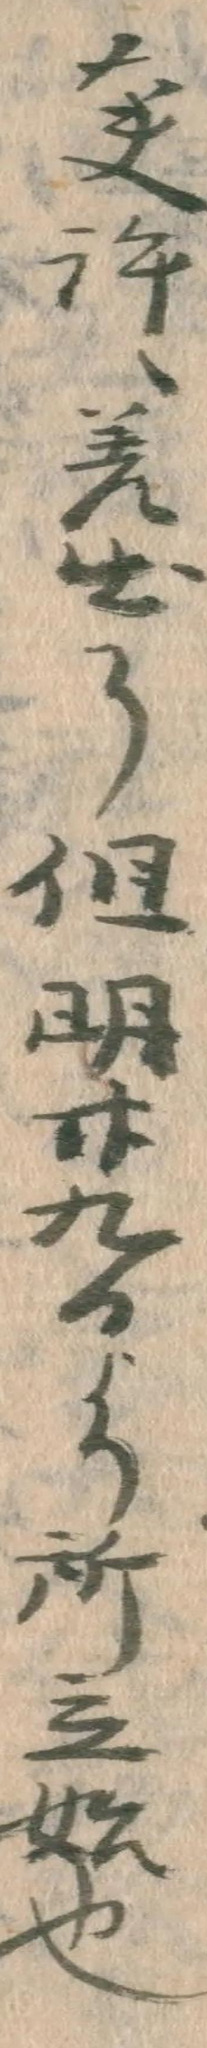大夫許へ差出了、但明廿九日より所立始也、
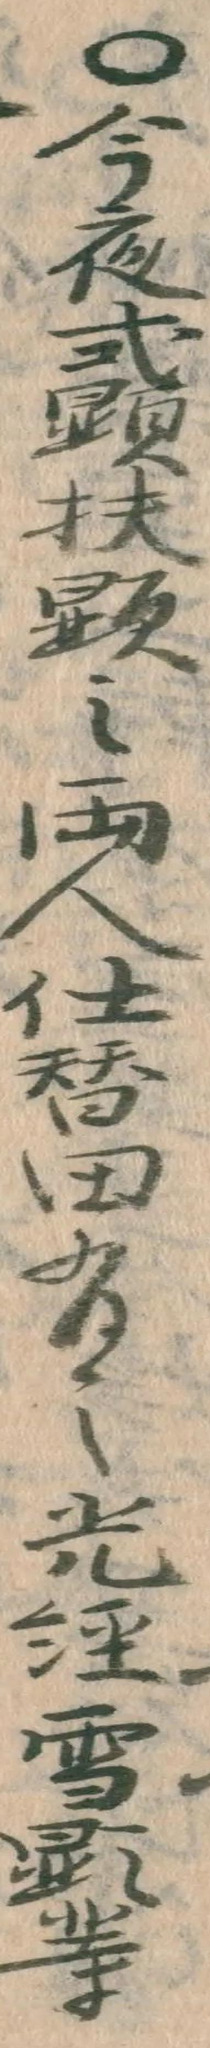○今夜式顕・扶顕之両人仕替田有之、光経・雪顕等
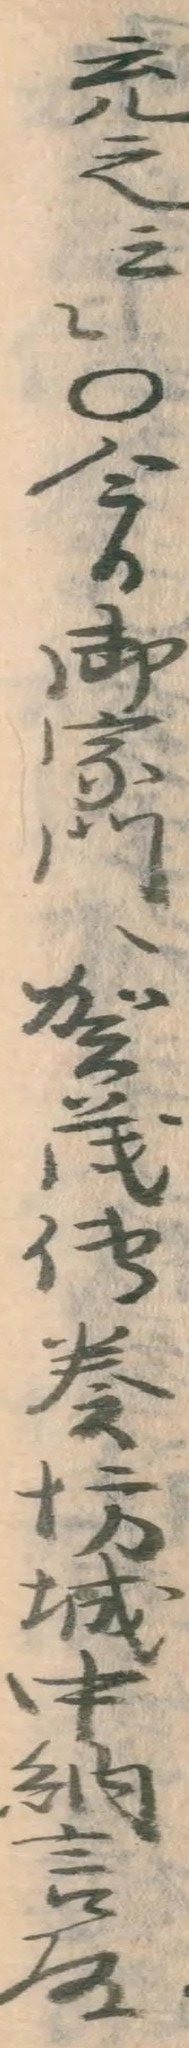充之云々、〇今日御家門へ賀茂傳奏坊城中納言殿
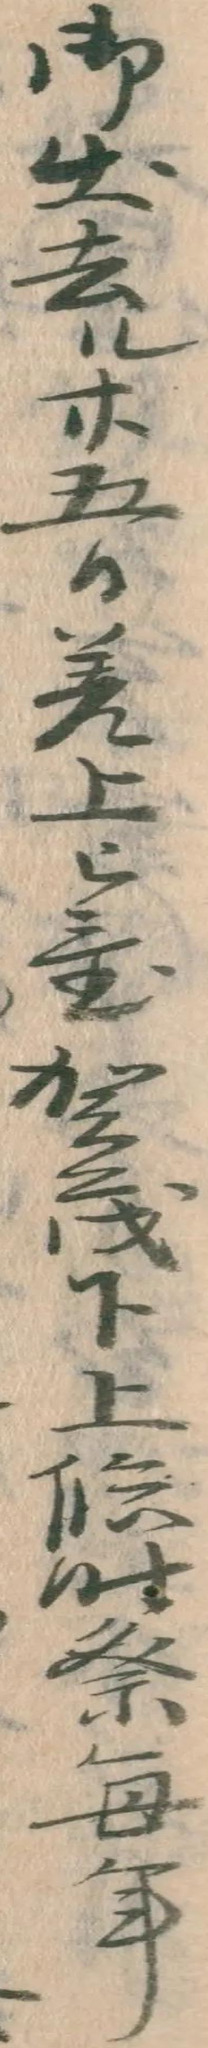御出、去ル廿五日差上被置、賀茂下上臨時毎年
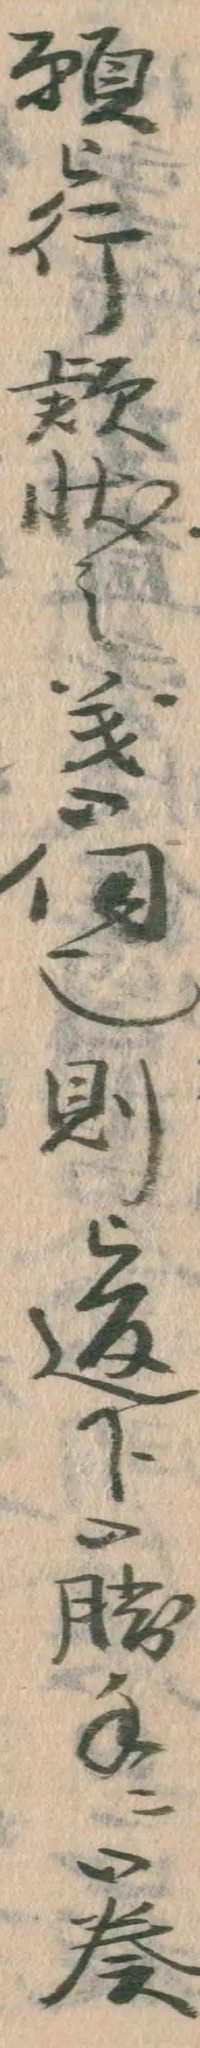願被行歎状之義御伺也、則被返下御勝手ニ御奏
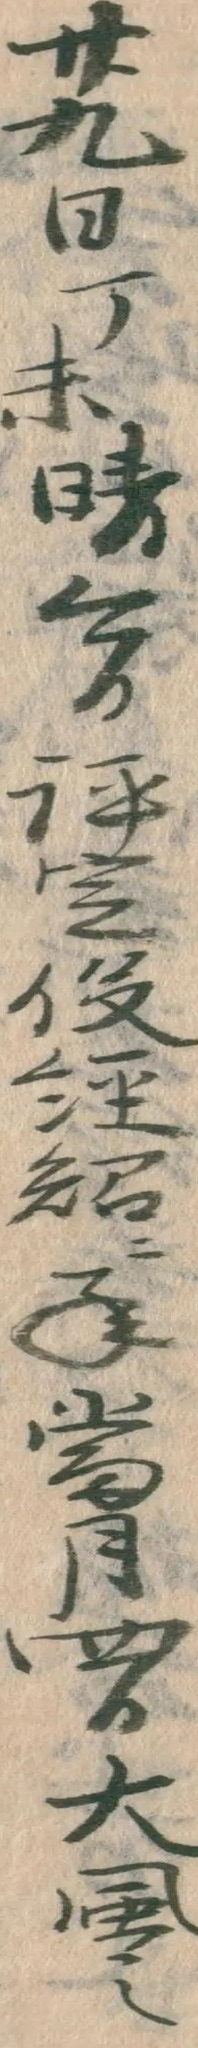廿九日丁未晴、今日評定役経紹ニ承、當月四日大風之
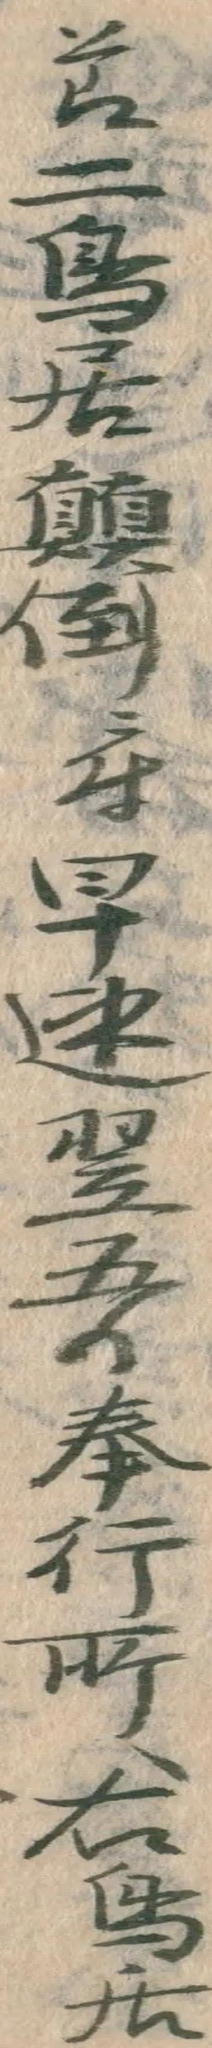節二鳥居顛倒ニ付、早速翌五日奉行所へ右鳥居
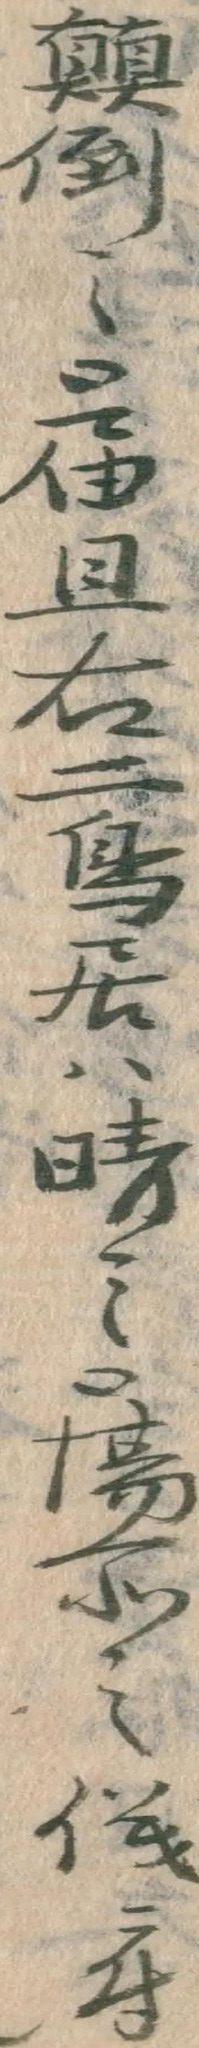顛倒之御届、且右二鳥居ハ晴之御場所之儀ニ付、
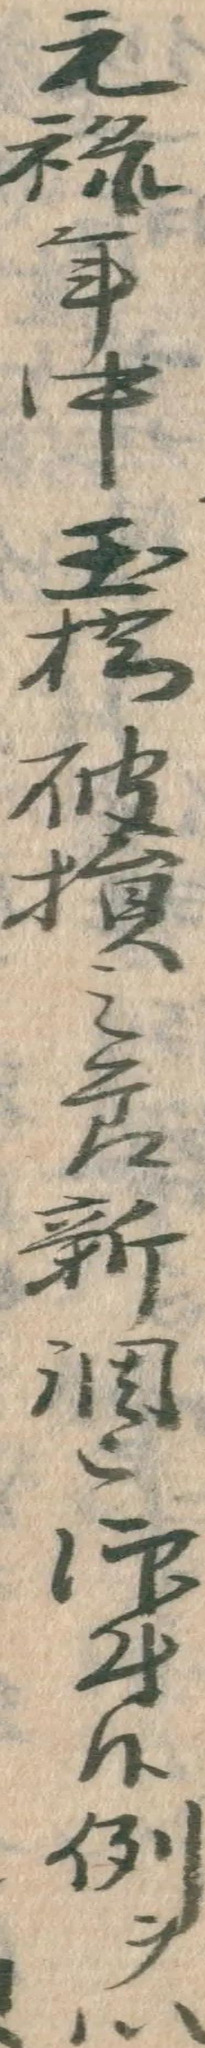元禄年中玉橋破損之節新調被仰付被下候例ヲ以、
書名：賀茂社記録. 第63冊
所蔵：国立国会図書館 National Diet Library, JAPAN
